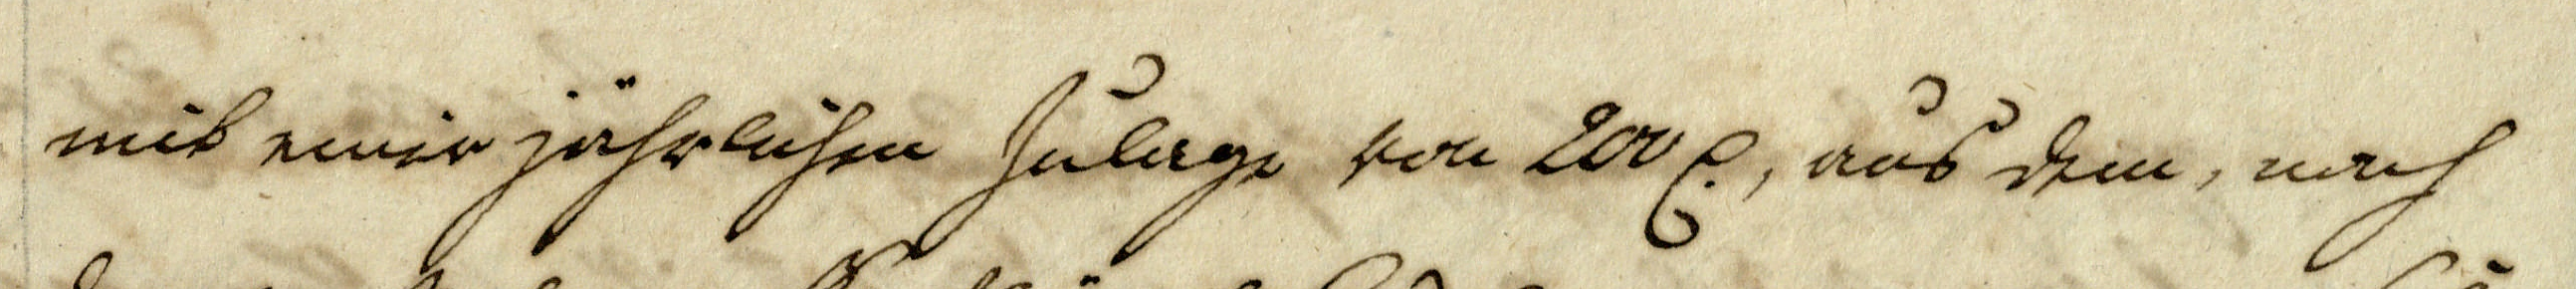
mit einer jährlichen Zulage von 200 l., aus dem, nach
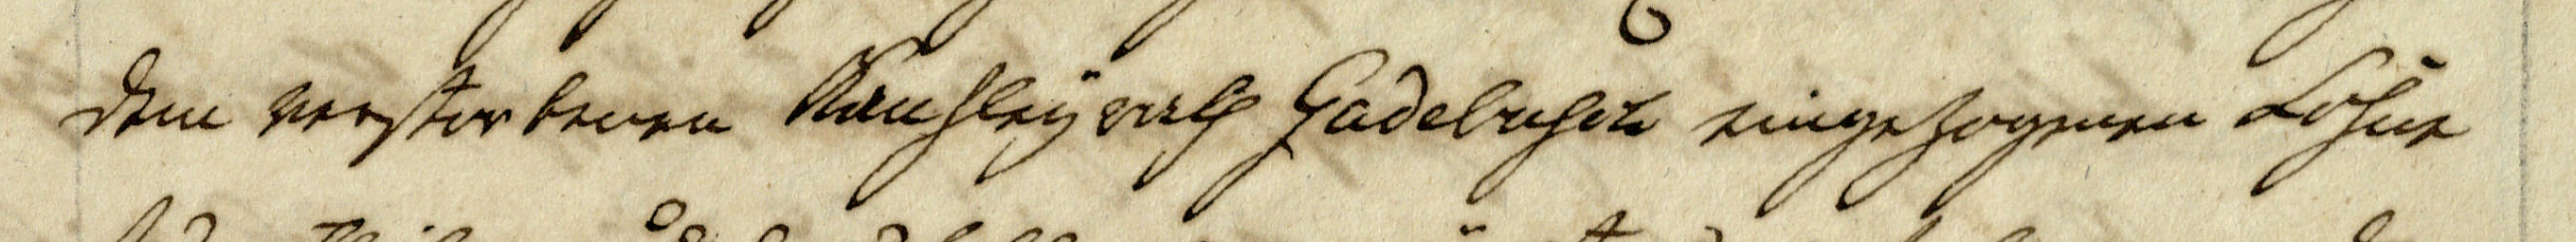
dem verstorbenen Kanzleÿrath Gadebusch eingezogenen Lohne
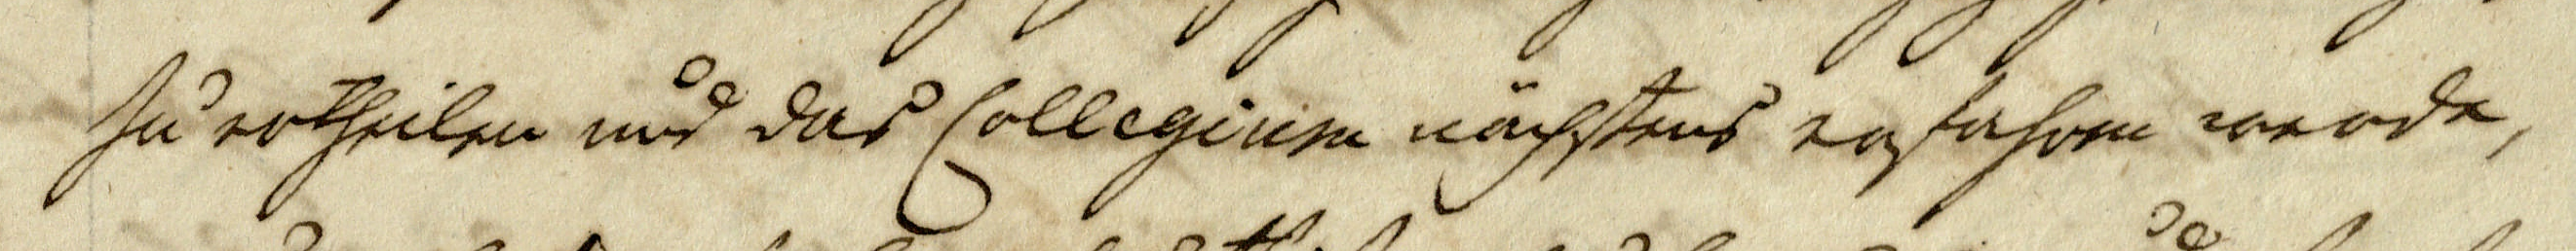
zu ertheilen und das Collegium nächstens erfahren werde,
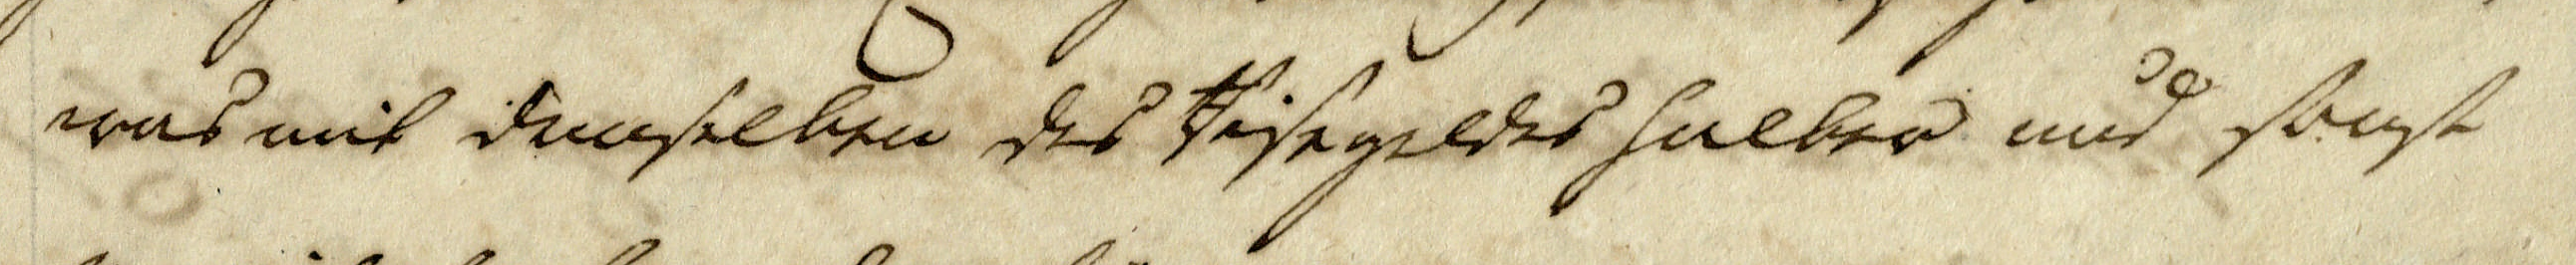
was mit demselben des Reisegeldes halber und sonst
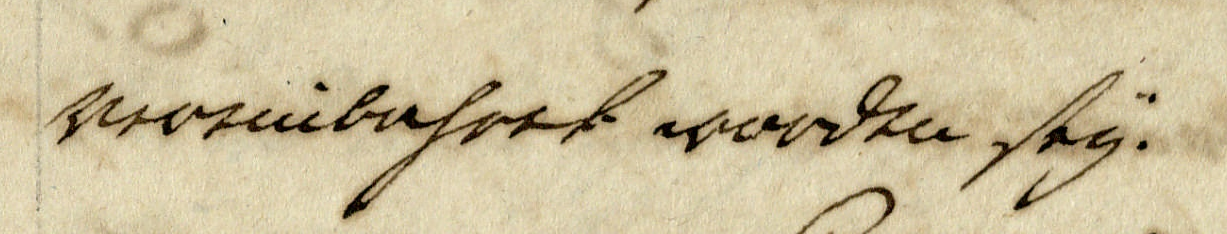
vereinbahret worden seÿ.
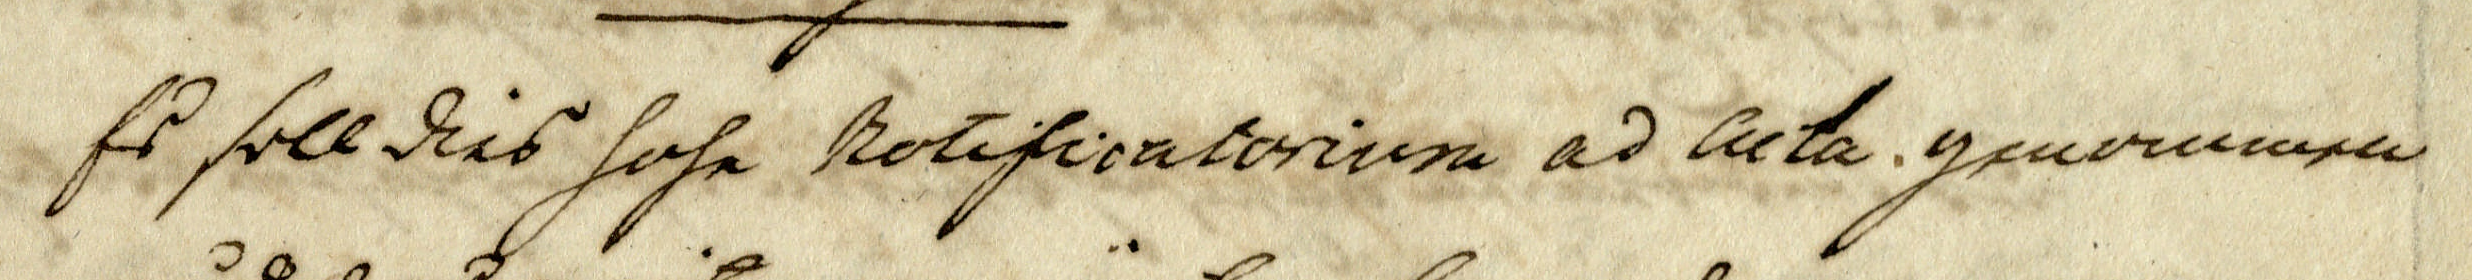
Es soll dies hohe Notificatorium ad Acta genommen
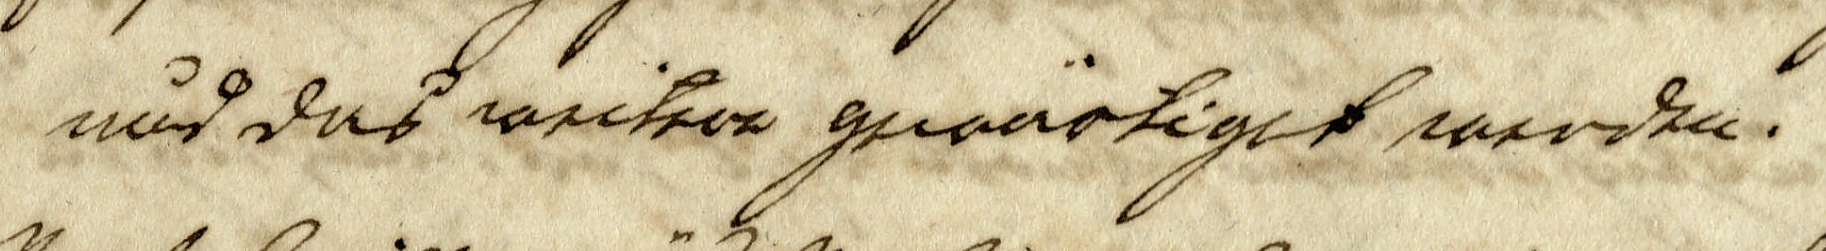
und das weitere gewärtiget werden.
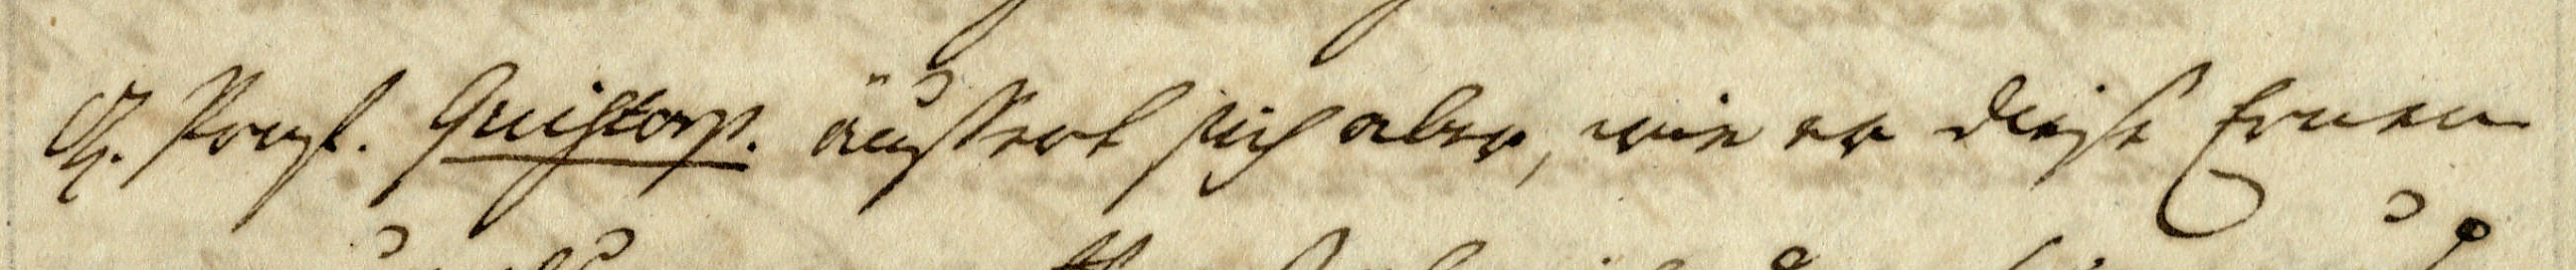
dh. Prof. Quistorp. äussert sich aber, wie der diese Ernen¬
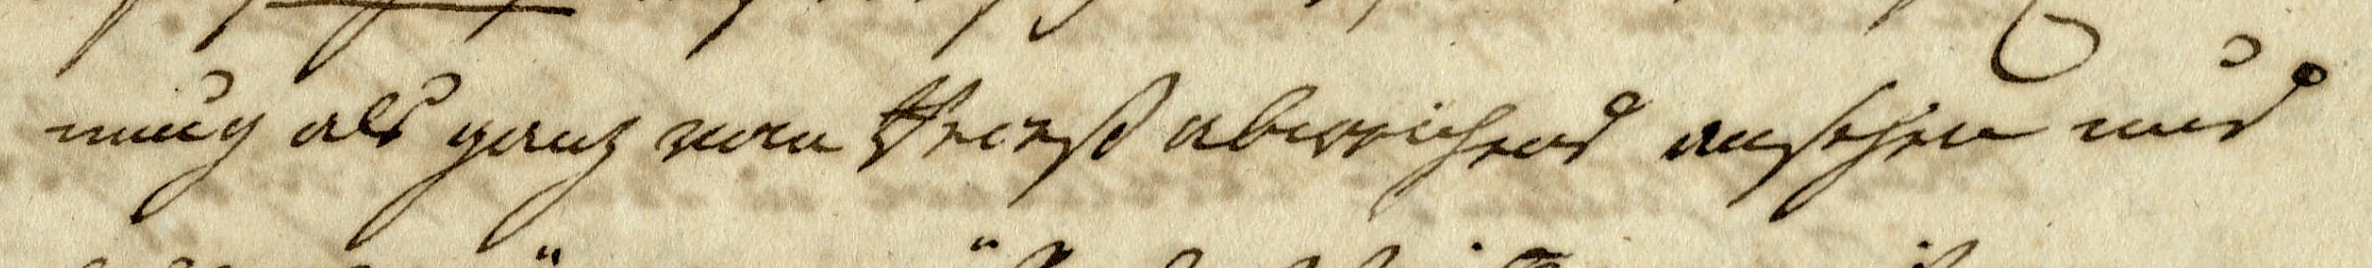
nung als ganz vom Receß abweichend ansehen und
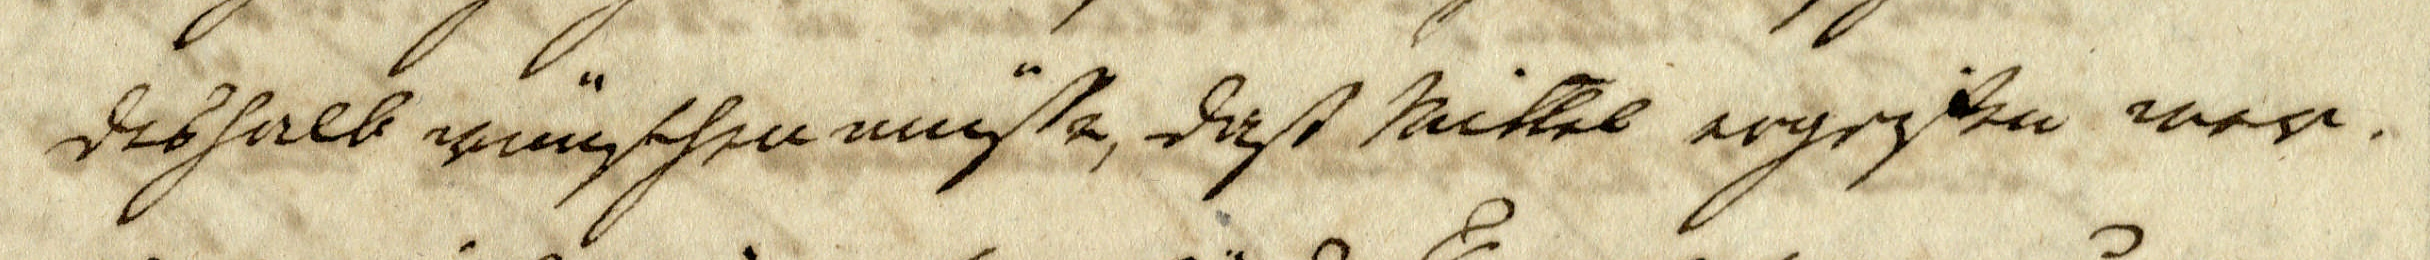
deshalb wünschen müsse, daß Mittel ergriffen wer¬
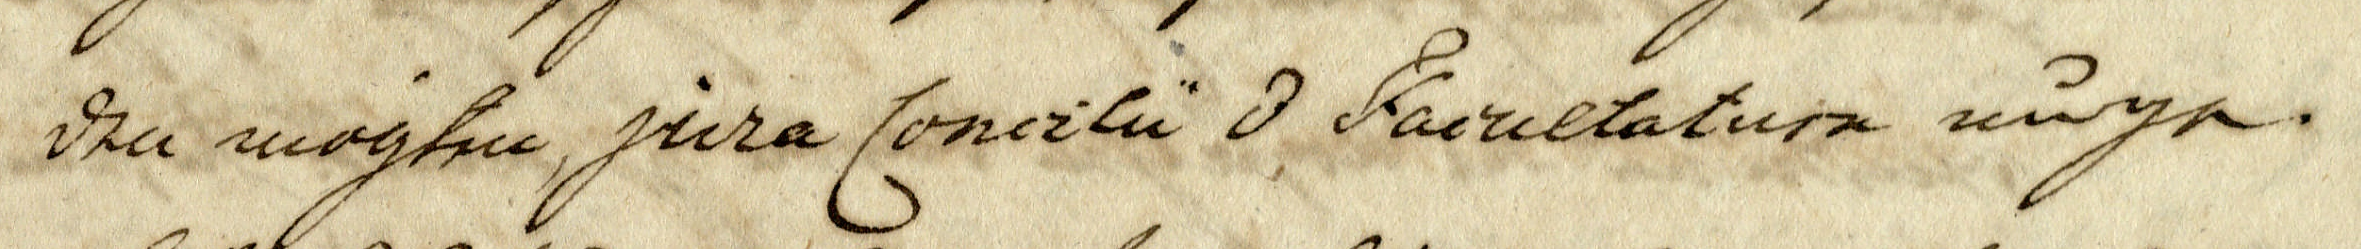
den mögten, jura Concilii et Facultatum unge¬
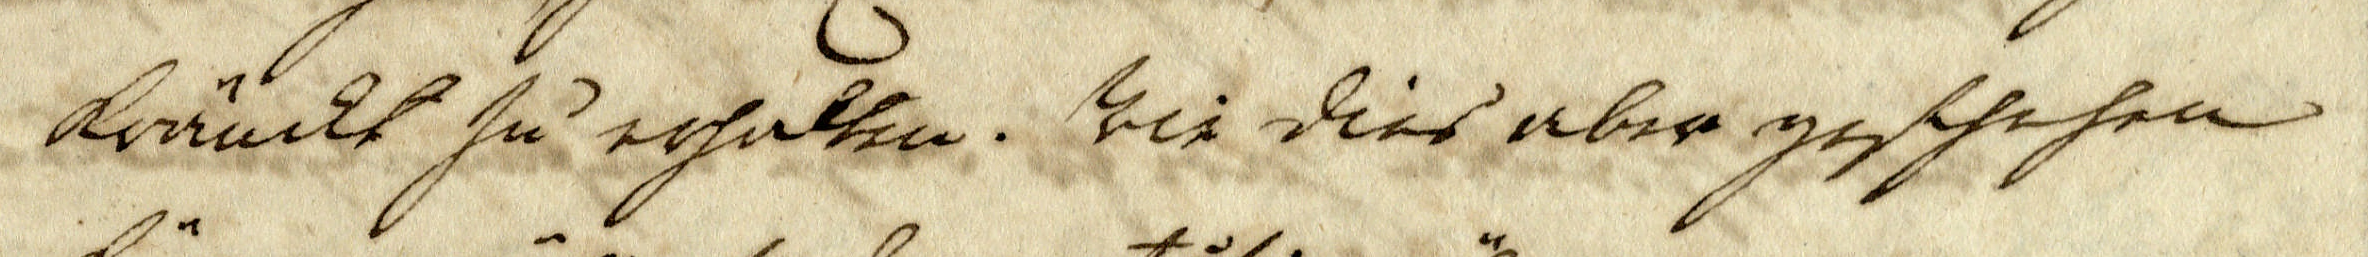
kränckt zu erhalten. Wie dies aber geschehen
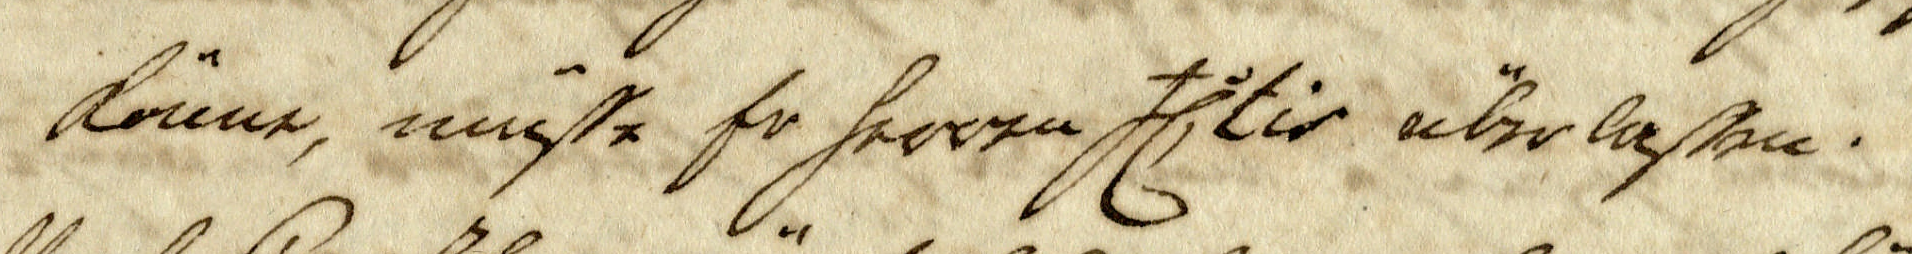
könne, müsse Er Herren Iltis überlassen.
